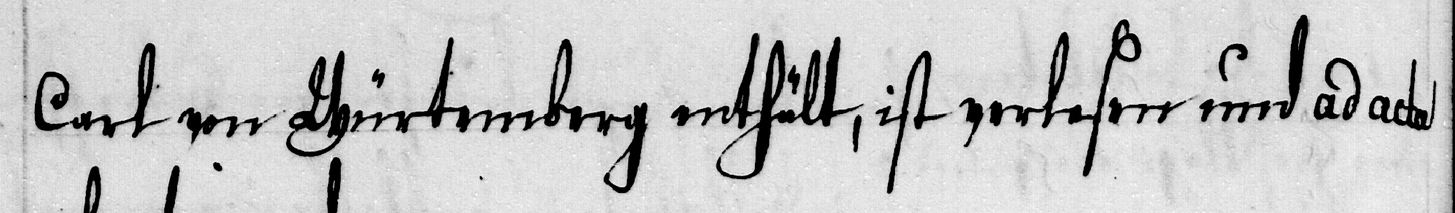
Carl von Würtemberg enthält, ist verlesen und ad acta
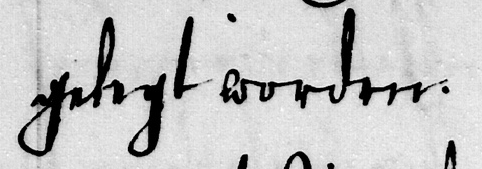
gelegt worden.
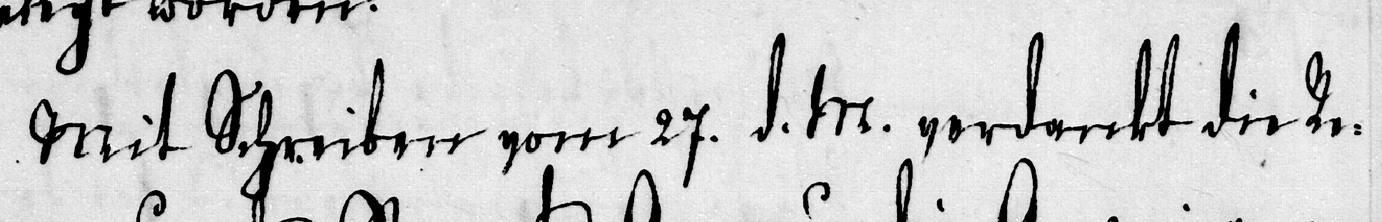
Mit Schreiben vom 27. d. M. verdankt die Re¬
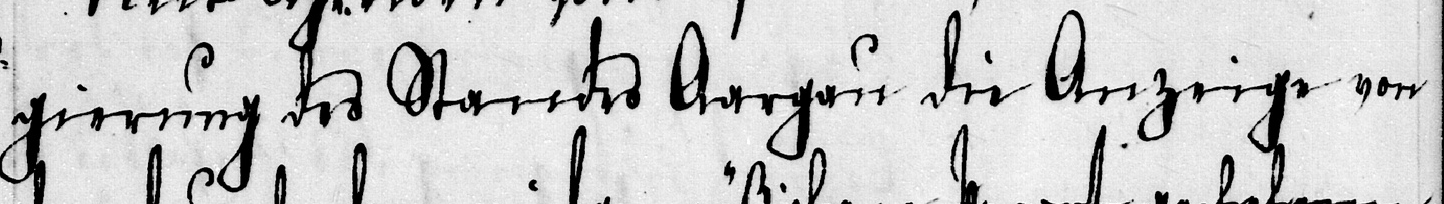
gierung des Standes Aargau die Anzeige von
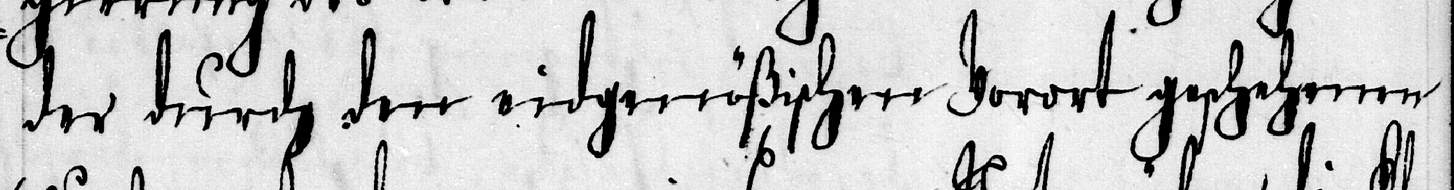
der durch den eidgenößischen Vorort geschehenen
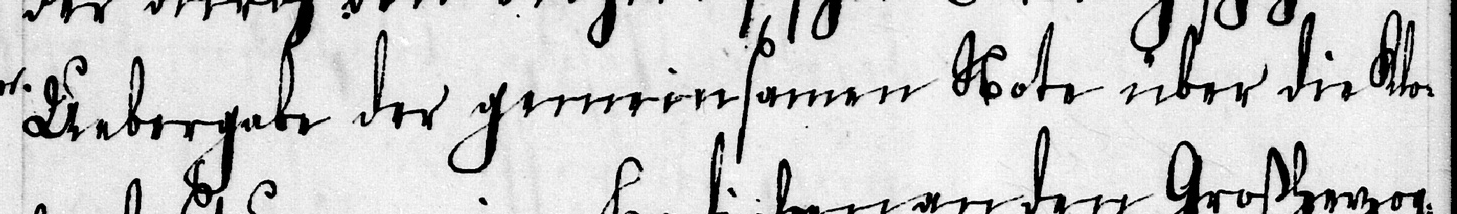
Uebergabe der gemeinsamen Note über die Klo¬
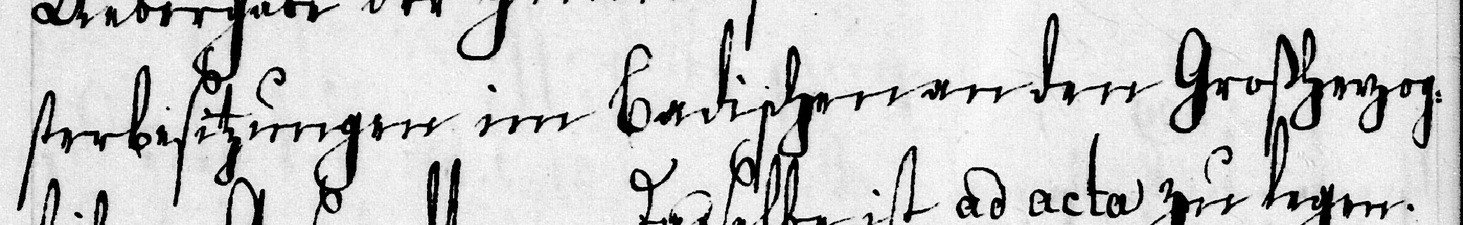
sterbesitzungen im Badischen an den Großherzog¬
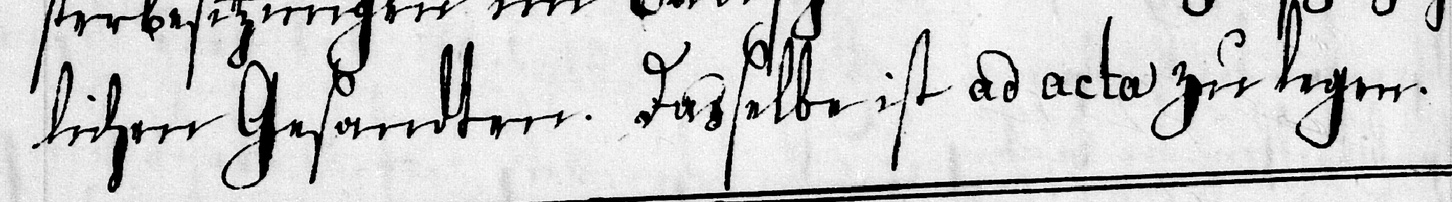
lichen Gesandten. Dasselbe ist ad acta zu legen.
